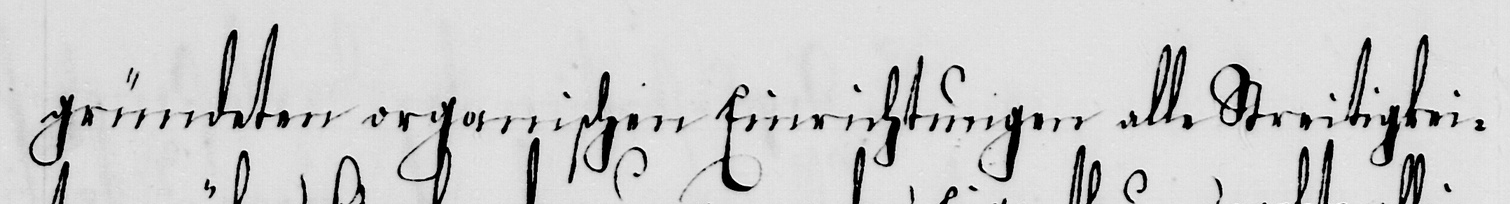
gründeten organischen Einrichtungen alle Streitigkei¬
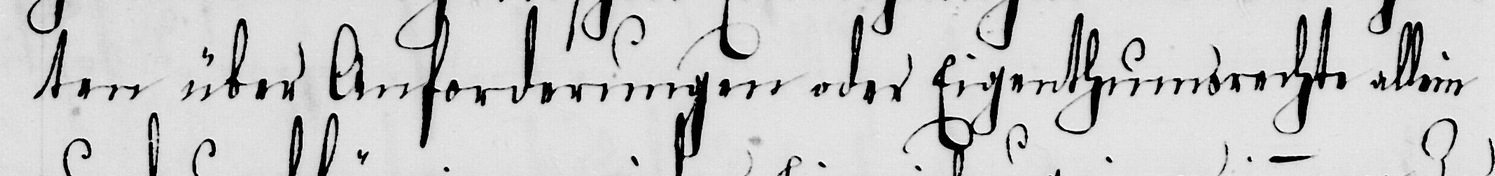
ten über Anforderungen oder Eigenthumsrechte allein
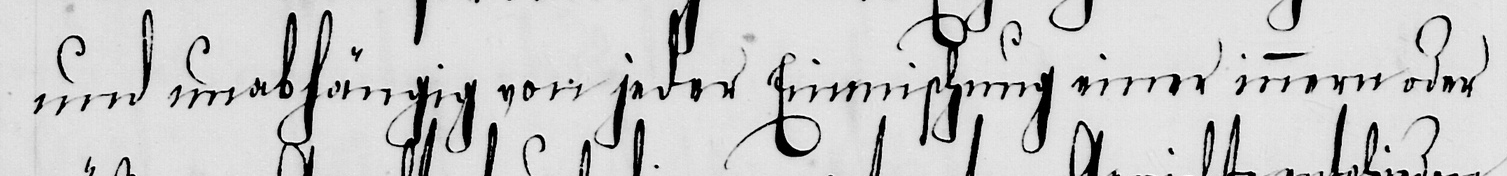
und unabhängig von jeder Einmischung einer innern oder
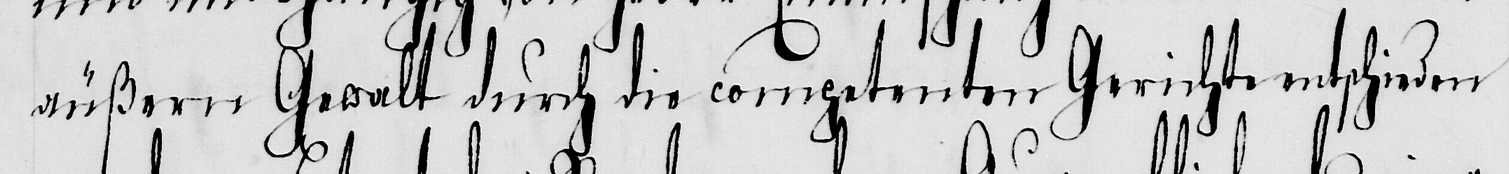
äußern Gewalt durch die competenten Gerichte des einge¬
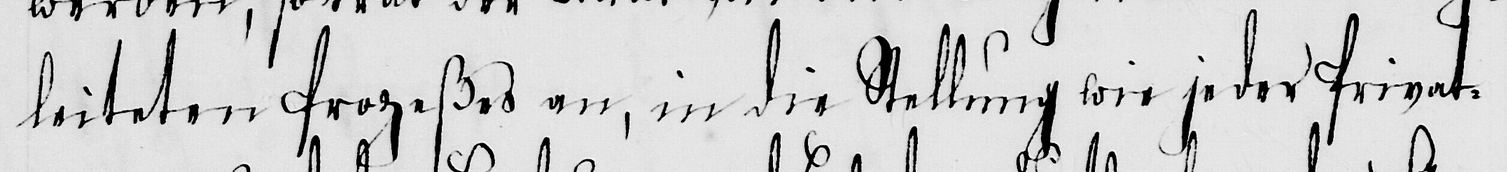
leiteten Prozeßes an, in die Stellung wie jeder Privat¬
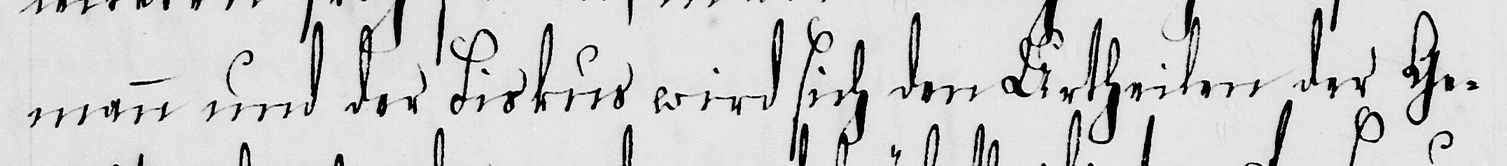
mann und der Fiskus wird sich den Urtheilen der Ge¬
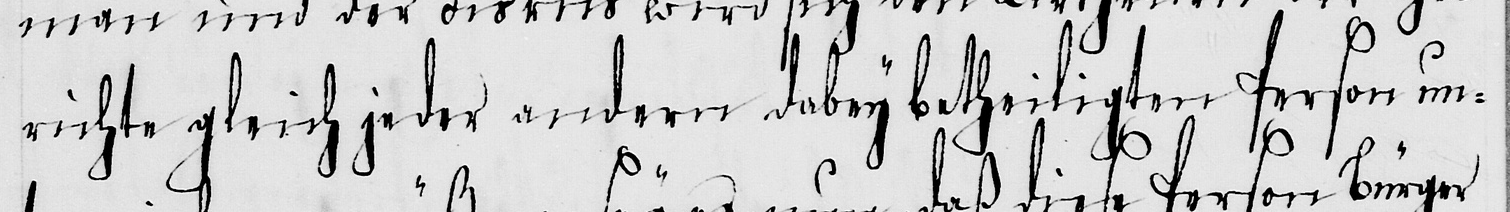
richte gleich jeder andern dabey betheiligten Person un¬
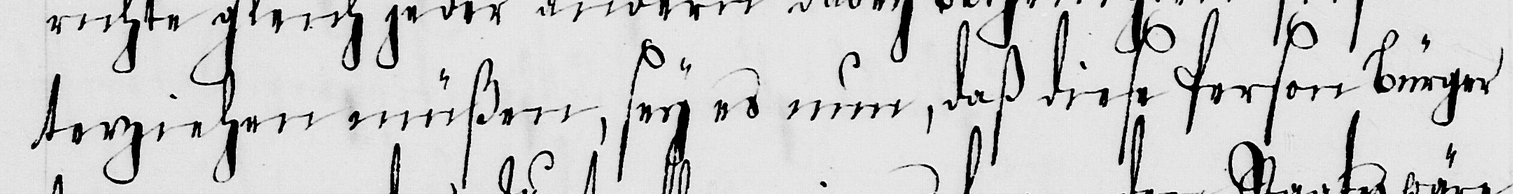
terziehen müßen, sey es nun, daß diese Person Bürger
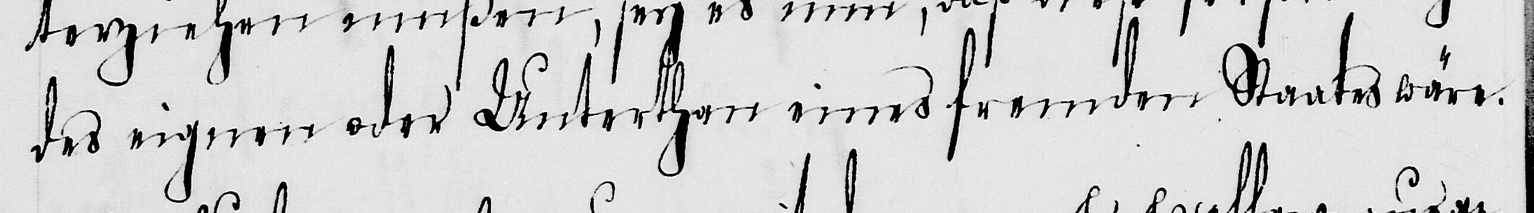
des eignen oder Unterthan eines fremden Staates wäre.
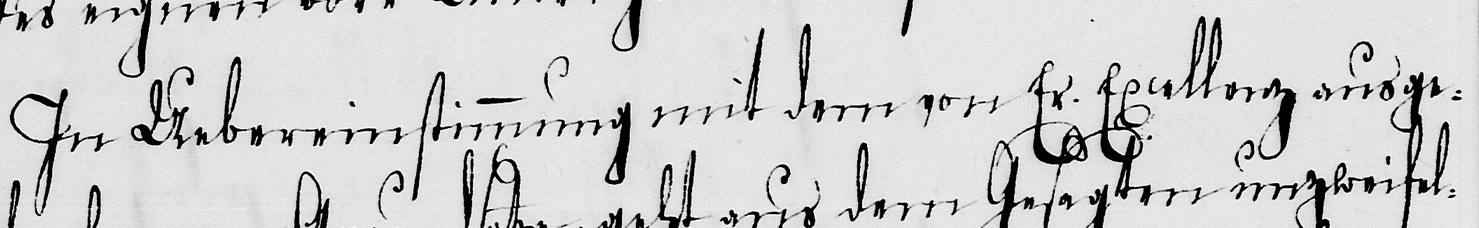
In Uebereinstimmung mit dem von Er. Excellenz ausge¬
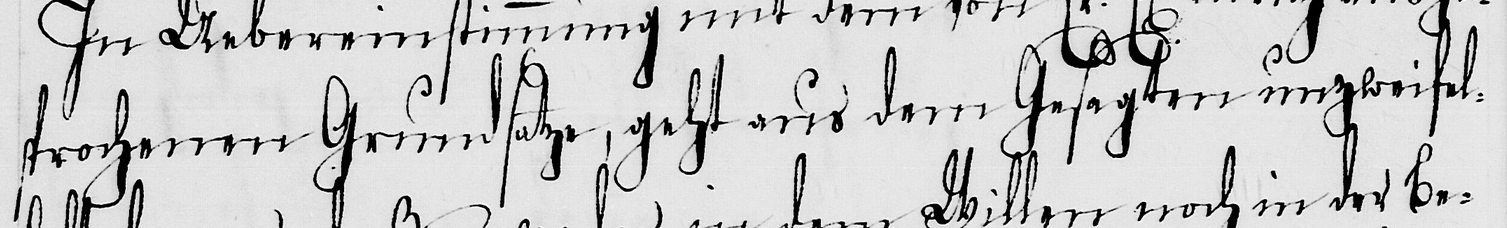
sprochenen Grundsatze, geht aus dem Gesagten unzweifel¬
